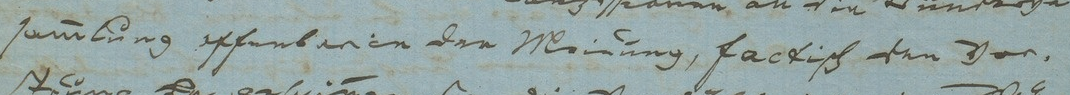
sammlung offenbar in der Meinung, factisch den Vor-
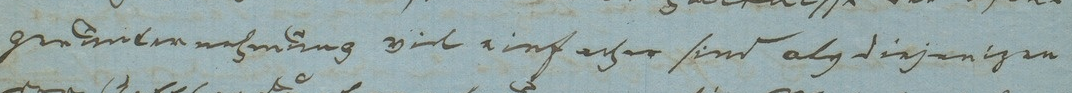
genunternehmung viel einfacher sind als diejenigen
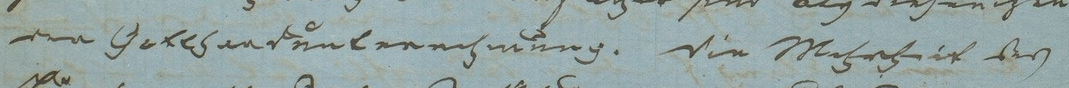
der Gotthardunternehmung. Die Mehrheit des
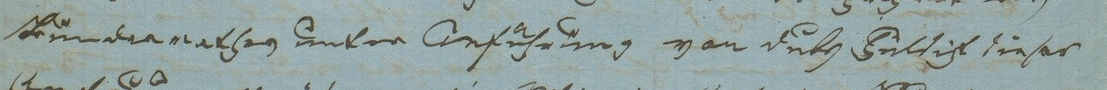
Bundesrathes unter Anführung von Dubs huldigt dieser
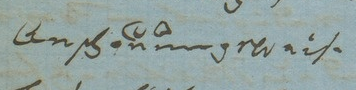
Anschauungsweise.
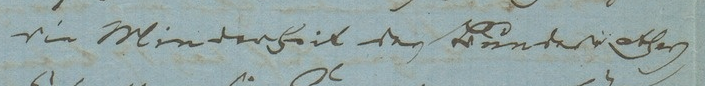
Die Minderheit des Bundesrathes,
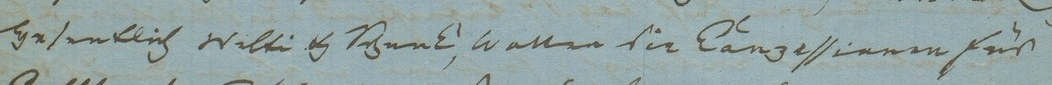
wesentlich Welti & Schenk, wollen die Conzessionen für
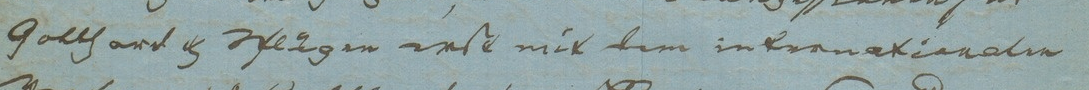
Gotthard & Splügen erst mit dem internationalen
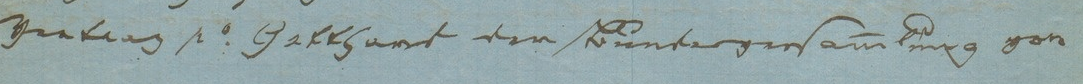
Vertrag poGotthard der Bundesversammlung vor-
